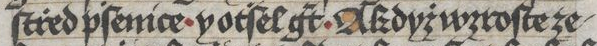ſtṙed pẛeníce.y otẛel ḡt.Akdyż wzroſte ze¬
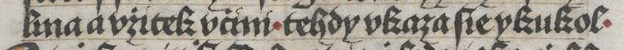lina a vżitek vċini.tehdy vkaza ſie ykukol.
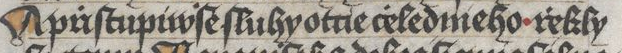A pṙiſtupiwẛe ſluhy otcie ċelednieho.ṙekly¬
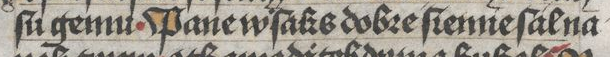ſu gemu.Pane wẛaks dobré ſiemíe ſál na
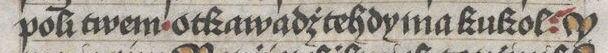poli twem.otkawadż tehdy ma kukol?Y
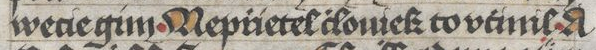wecie gím.Nepṙíetel ċlouiek to vċinil.A
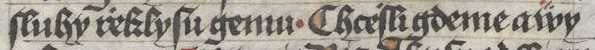ſluhy ṙekly ſu gemu.Chceẛli gdeme a wy¬
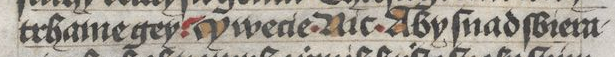trhanie gey?Y wecie.Nic.Aby ſnad ſbiera¬
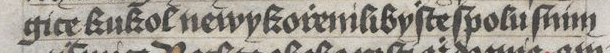gice kukol newykoṙenili byẛte ſpolu ſním
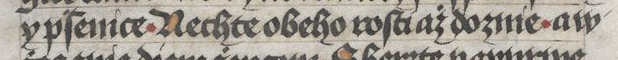y pẛenice.Nechte obeho roſti aż doznie.a w¬
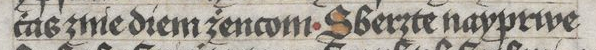ċas znie díem żencom.Sberzte nayprwe¬
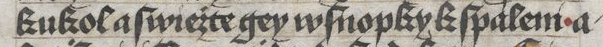kukol a ſwieżte gey wſnopky k ſpalení.a¬
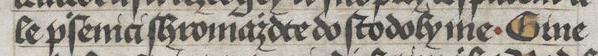le pẛenici ſhromażdte do ſtodoly me.Gine
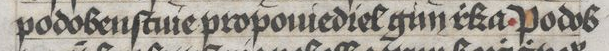podobenſtuíe propouiediel gim ṙka.Podob¬
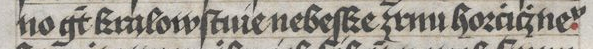no ḡt kralowſtuíe nebeſke zrnu horċicżnev.
